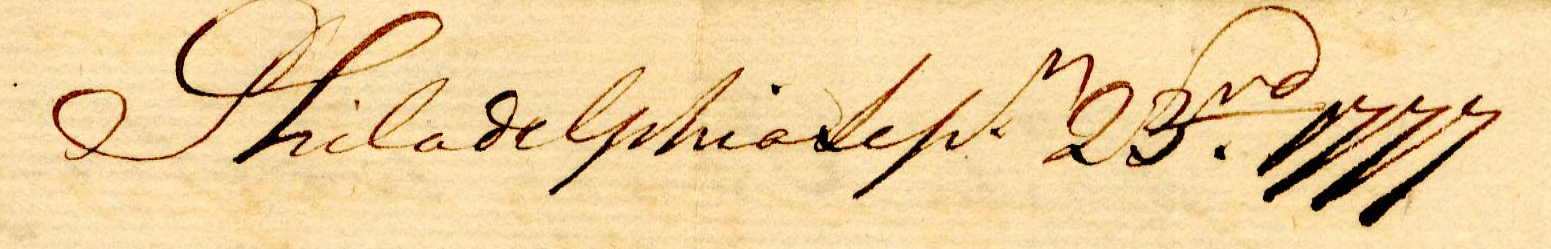Philadelphia Sep^r. 23^rd. 1777
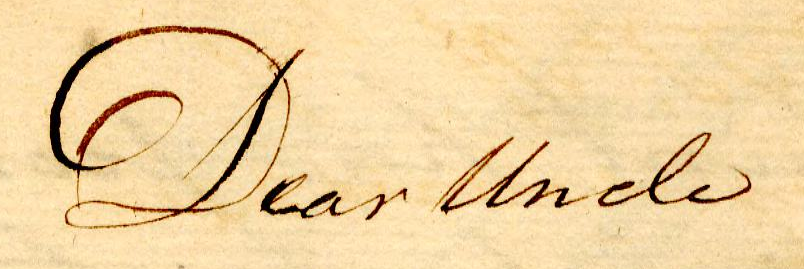Dear Uncle
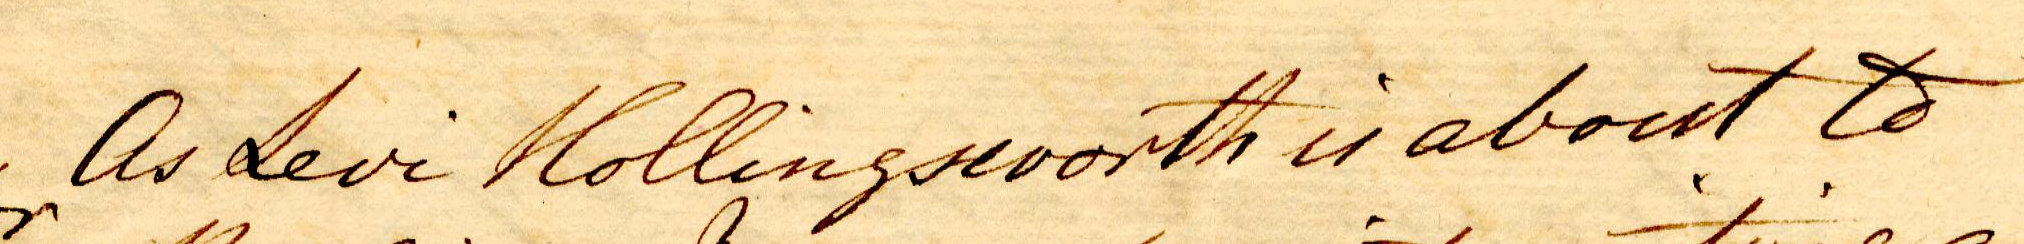As Levi Hollingsworth is about to
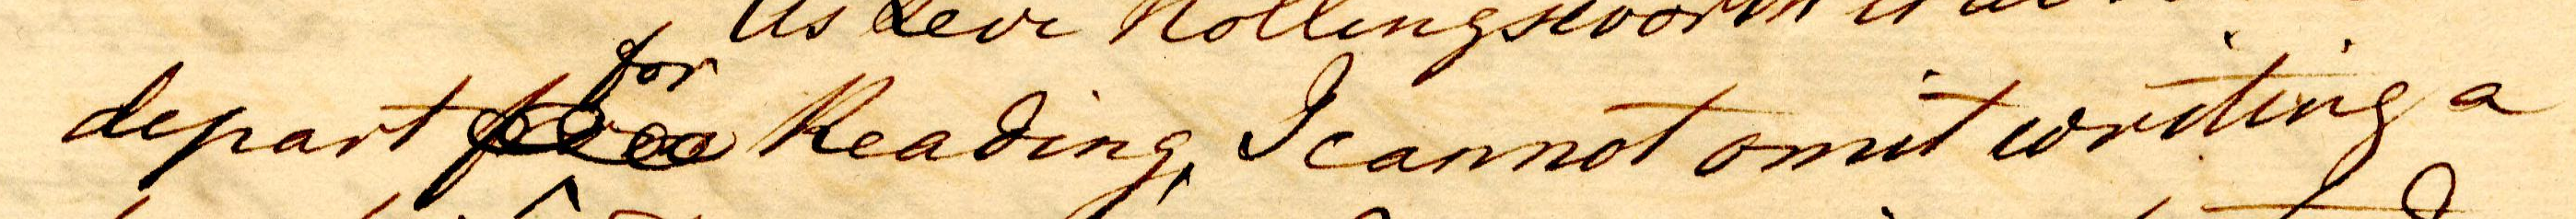depart for Reading, I cannot omit writing a
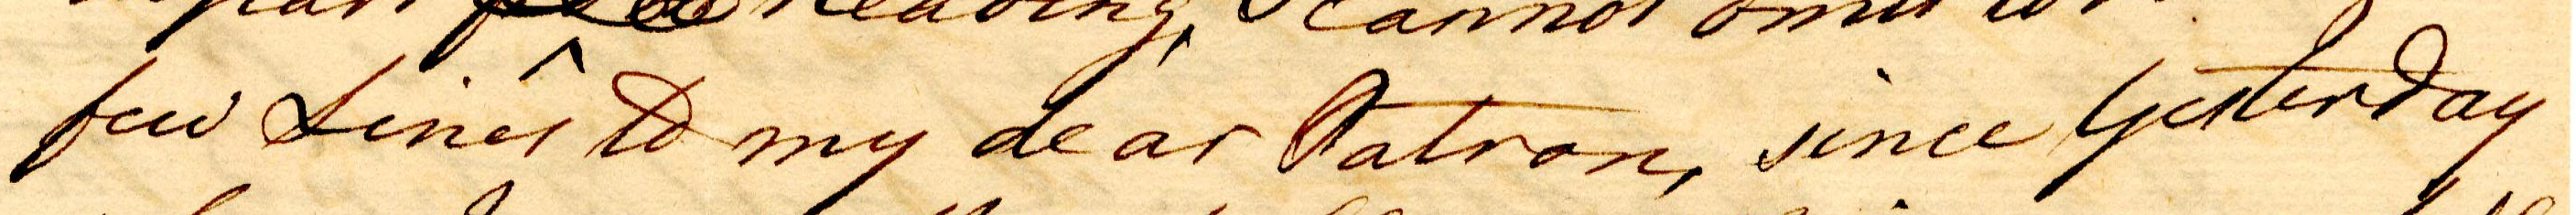few Lines to my dear Patron, since yesterday
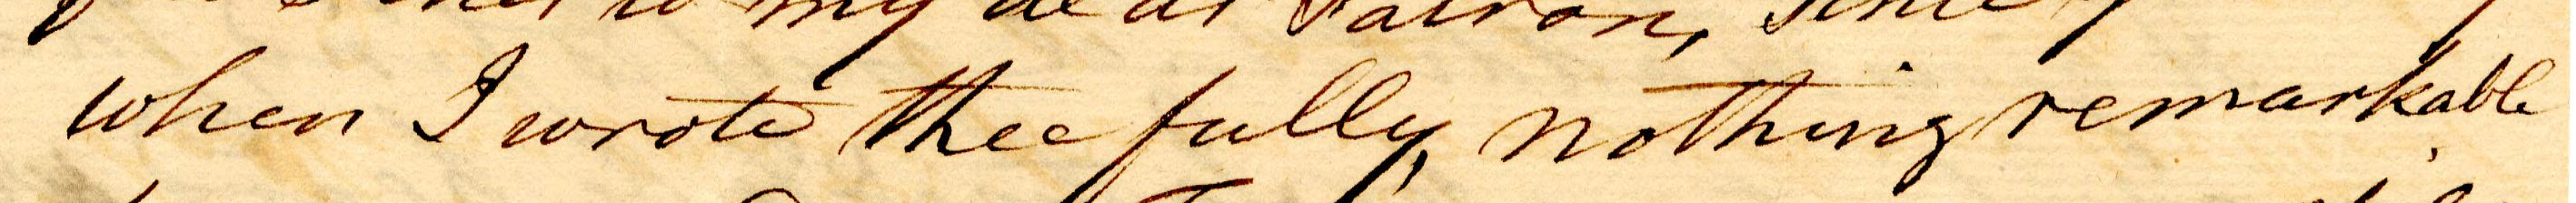when I wrote thee fully, nothing remarkable
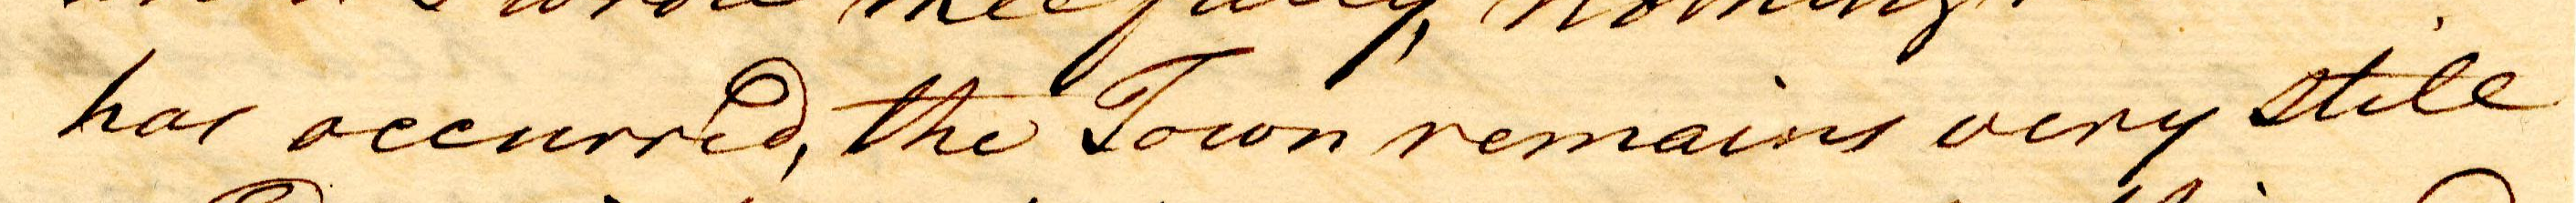has occurred, the Town remains very still
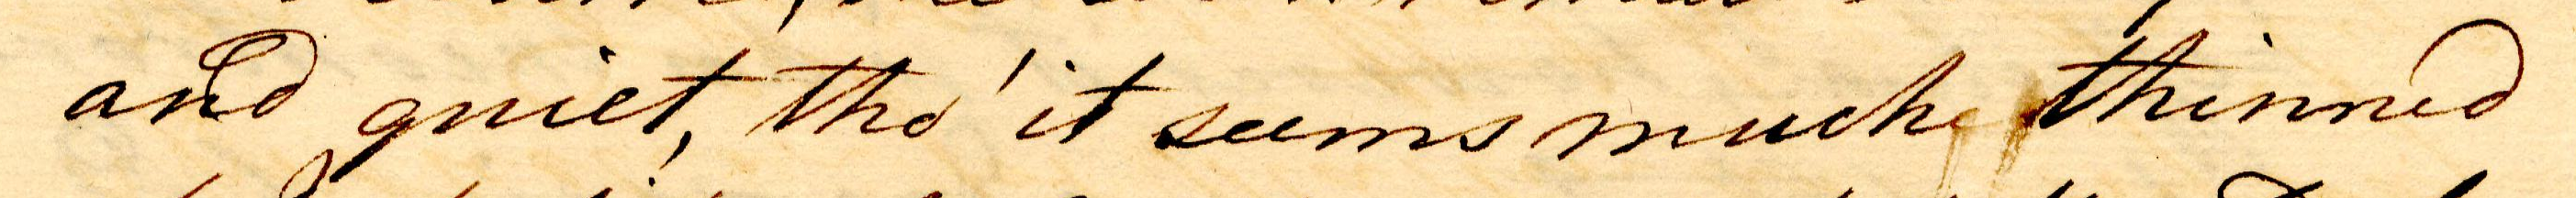and quiet, tho' it seems much thinned
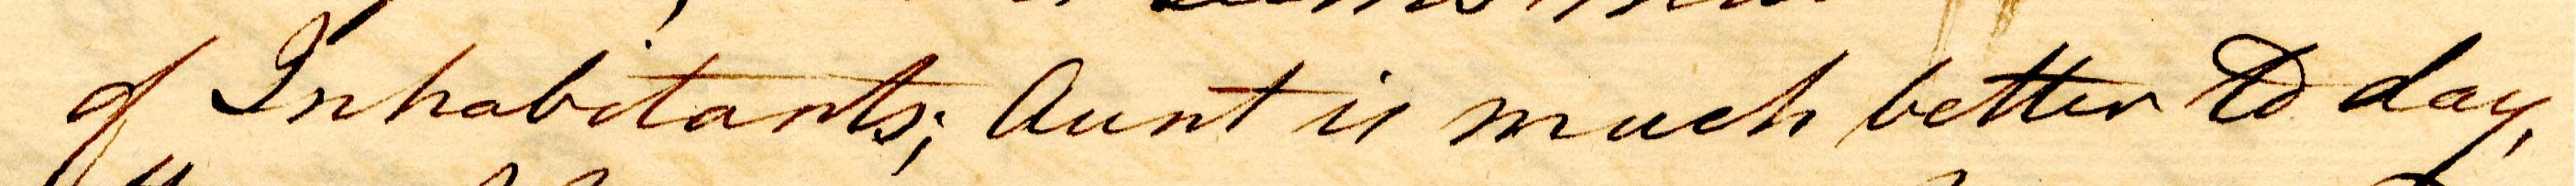of Inhabitants; Aunt is much better to day,
